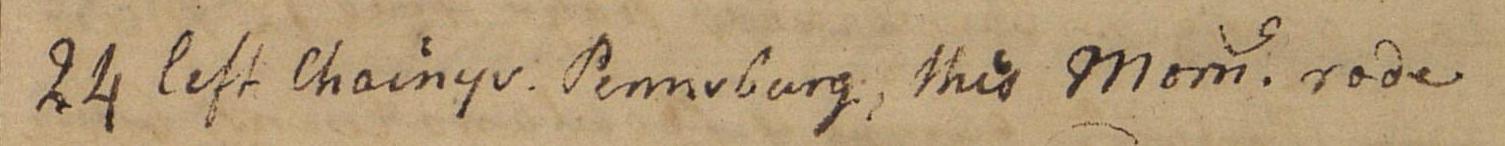24 left Chainys. Pennsburg, this Morn^g. rode
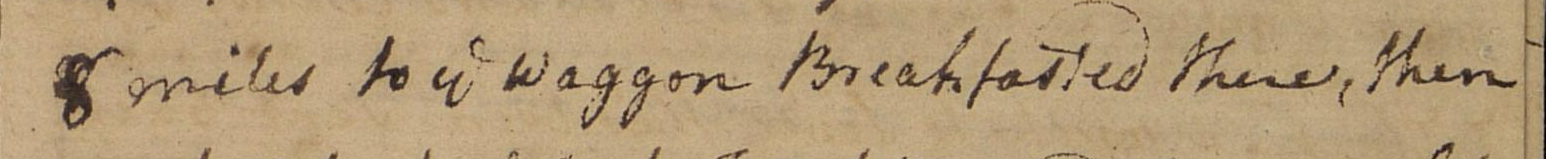8 miles to y^e waggon Breakfasted there, then
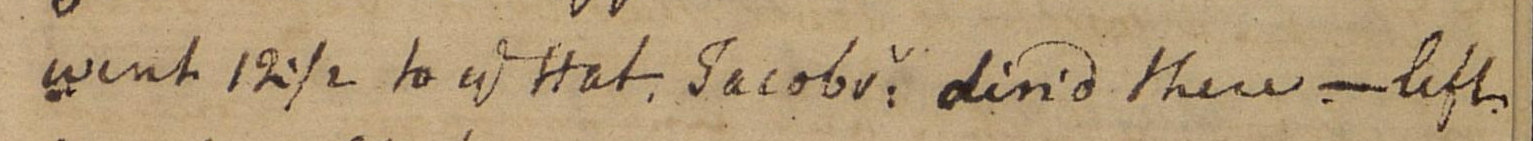went 11 1/2 to y^e Hat Jacobs^s: din'd there- left
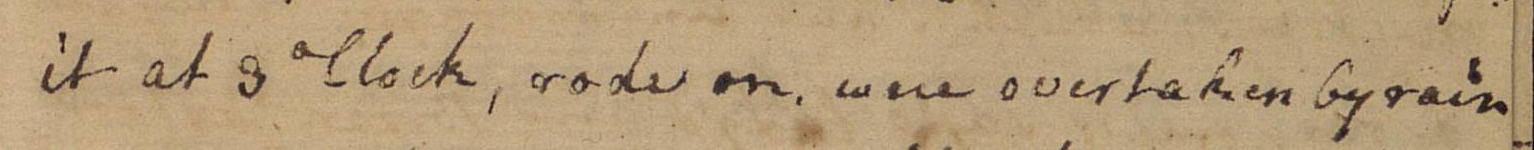it at 3 ^oClock, rode on, were overtaken by rain
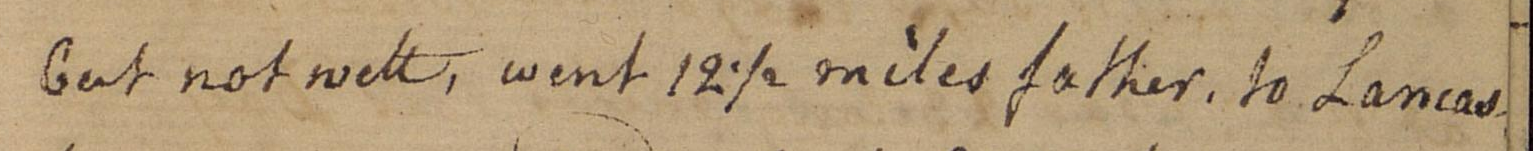but not welt?, went 12 1/2 miles father, to Lancas-
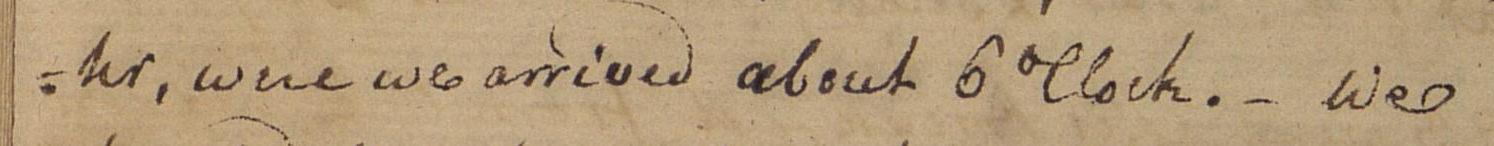-ter, were we arrived about 6 ^oClock.- We
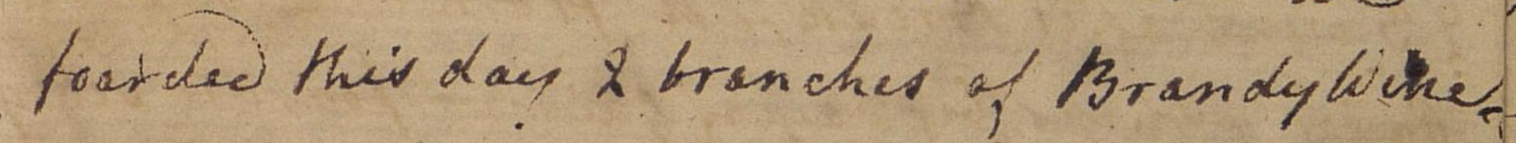foarded this day 2 branches of Brandy Wine
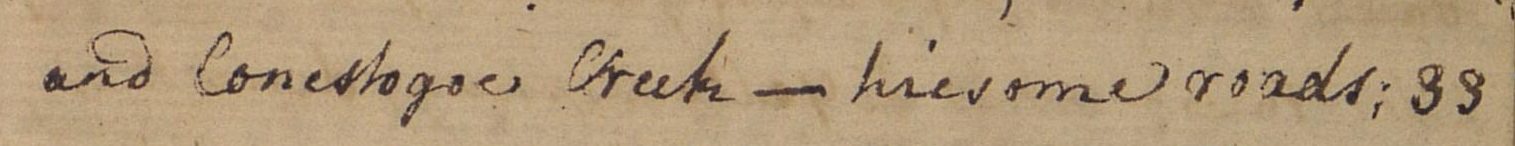and Conestogoe Creek- tiesome roads; 3 3
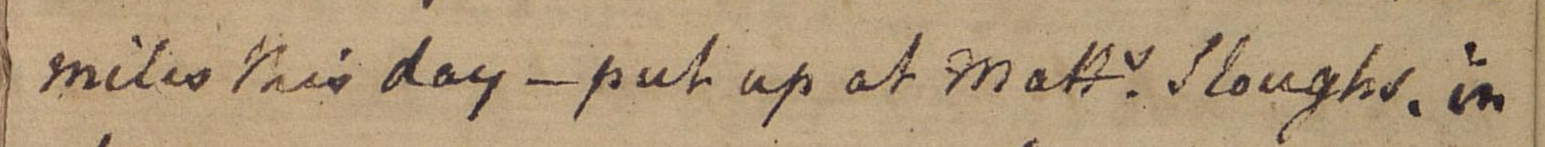miles this day- put up at Matt^s. Sloughs, in
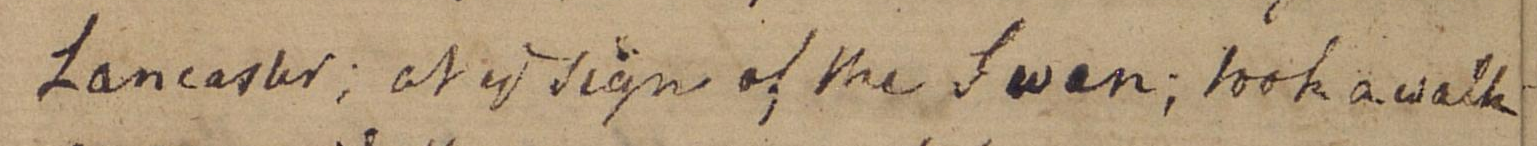Lancaster; at y^e sign of the Swan?; took a walk
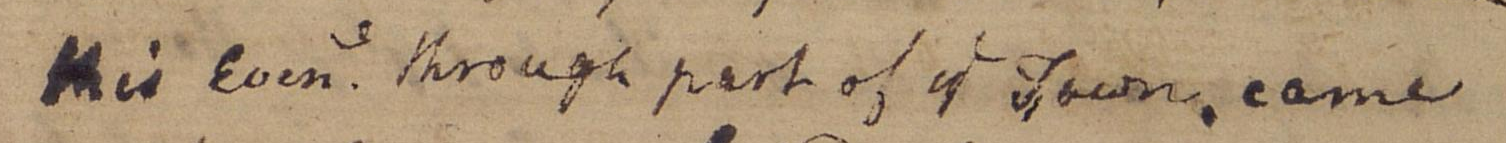this Even^g. through part of of Town, came
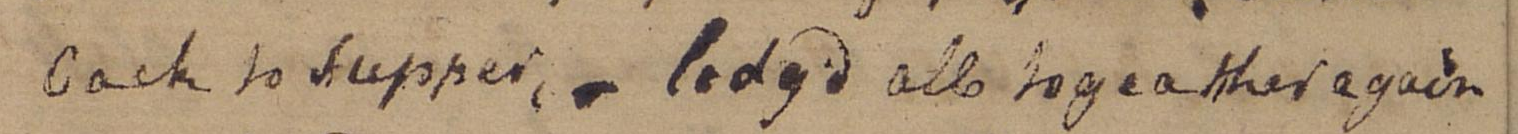back to supper,- lodg'd all togeather again
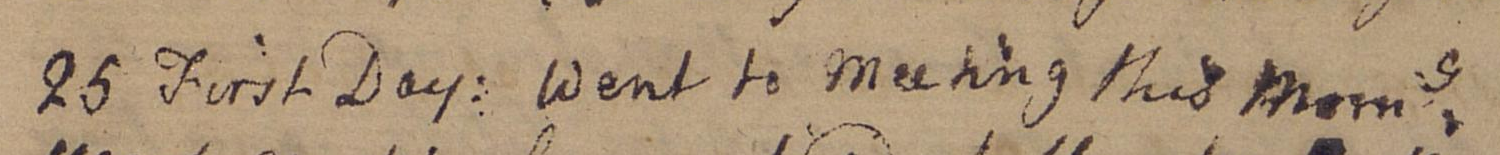25 First Day: Went to meeting this morn^g.
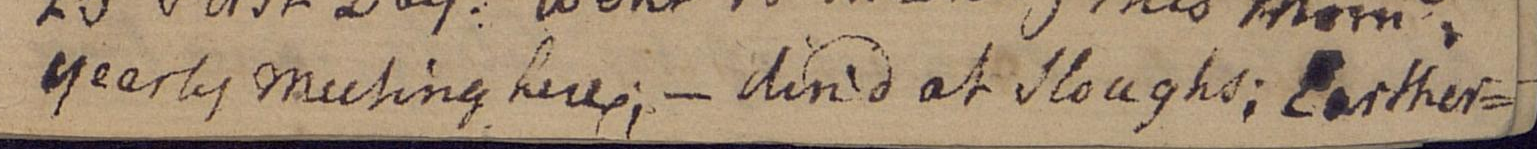yearly meeting here,- dind at Sloughs; Carther-
